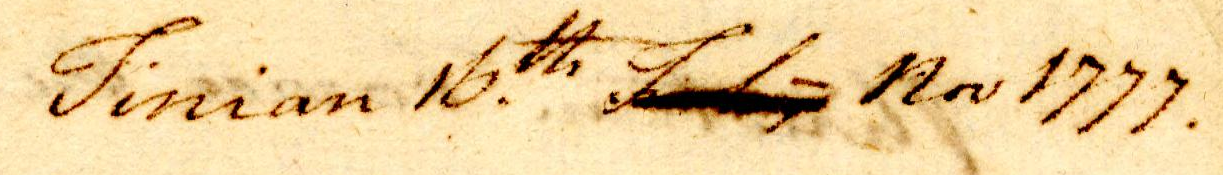Tinian 16^th. [____] Nov 1777.
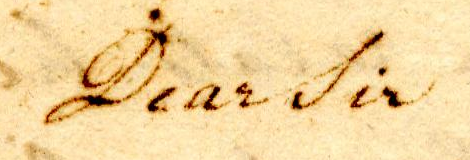Dear Sir
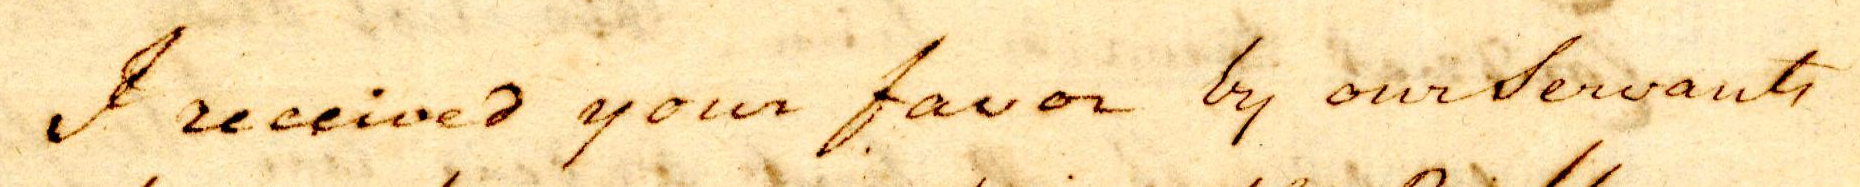I received your favor by our Servants
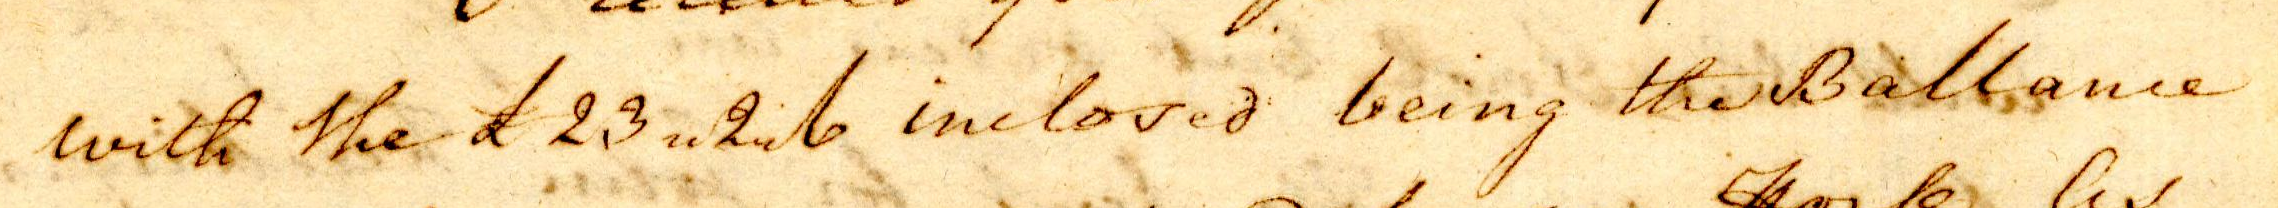with the £23.2.6 inclosed being the Ballance
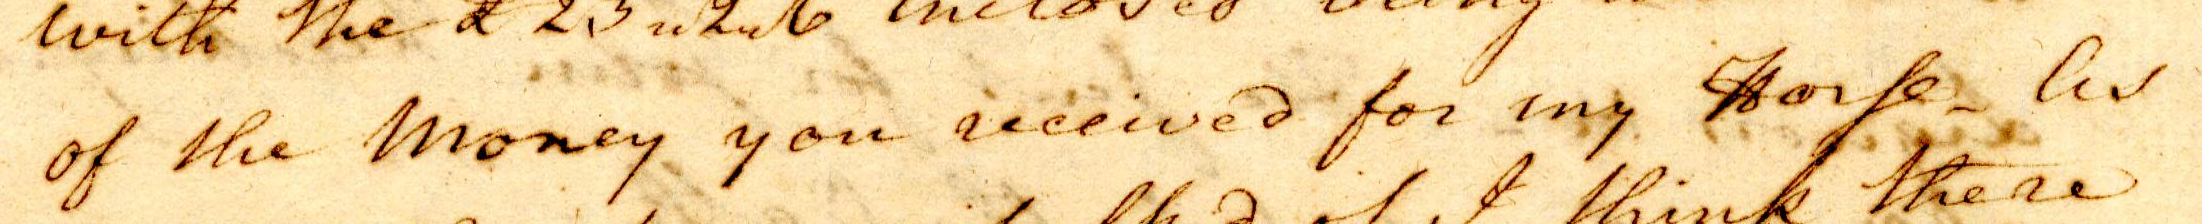of the Money you received for my Horse. As
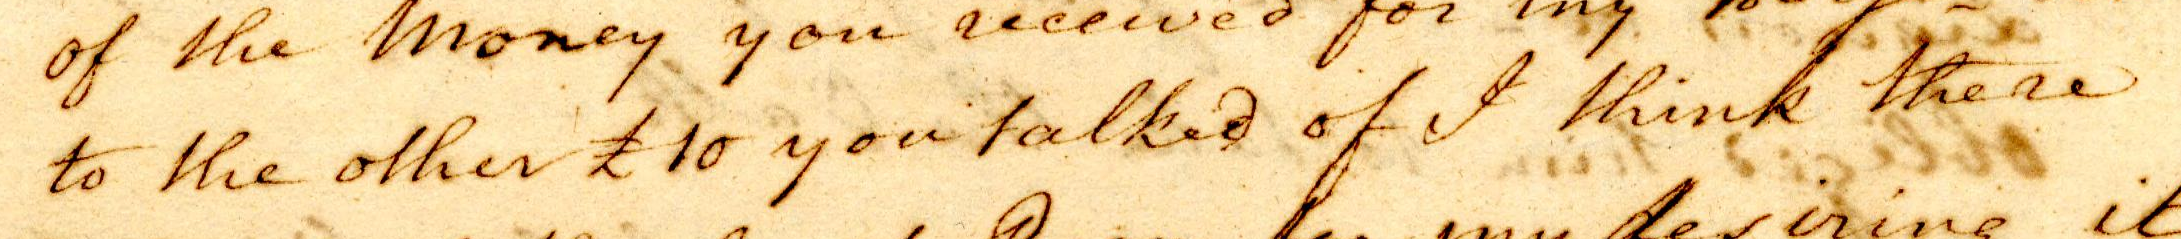to the other £10 you talked of I think there
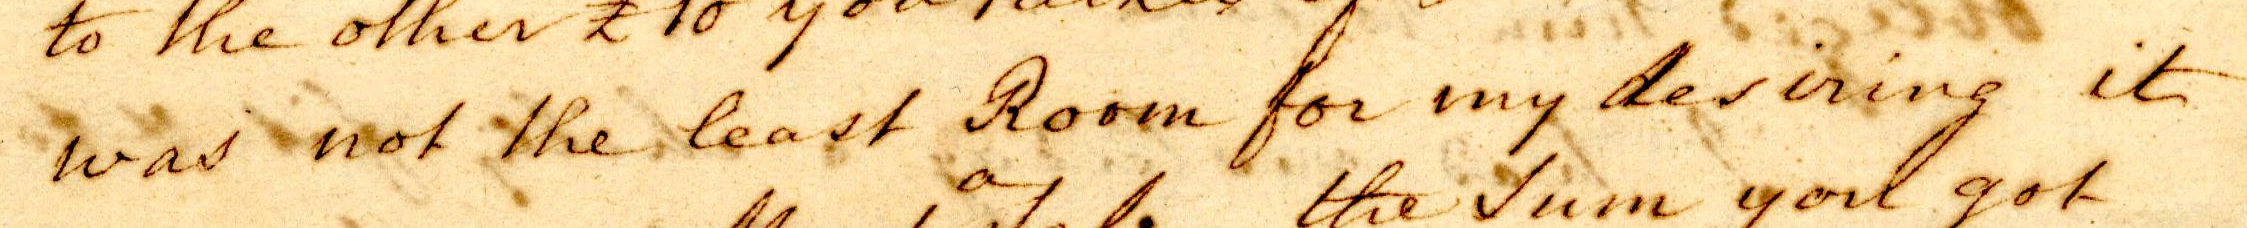was not the least Room for my desiring it
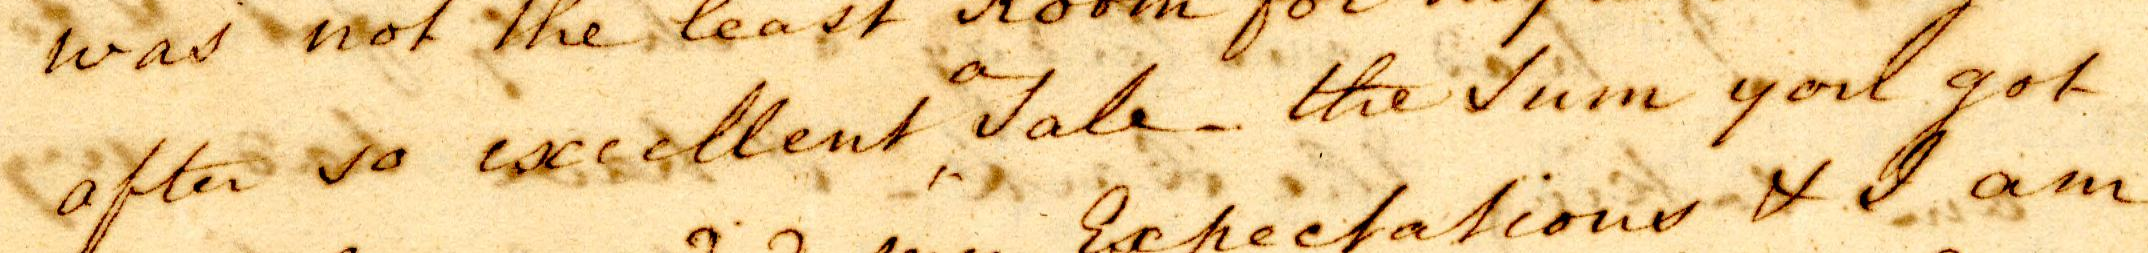after so excellent Sale. the sum you got
